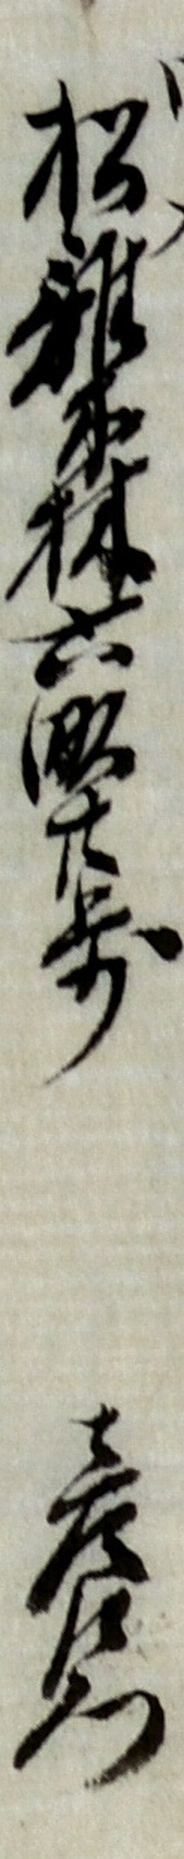松雑木林六畝廿歩彦左衛門
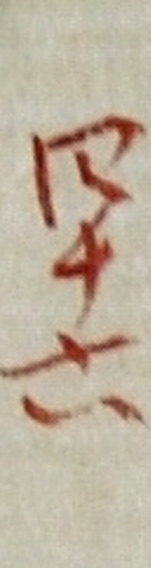四十六

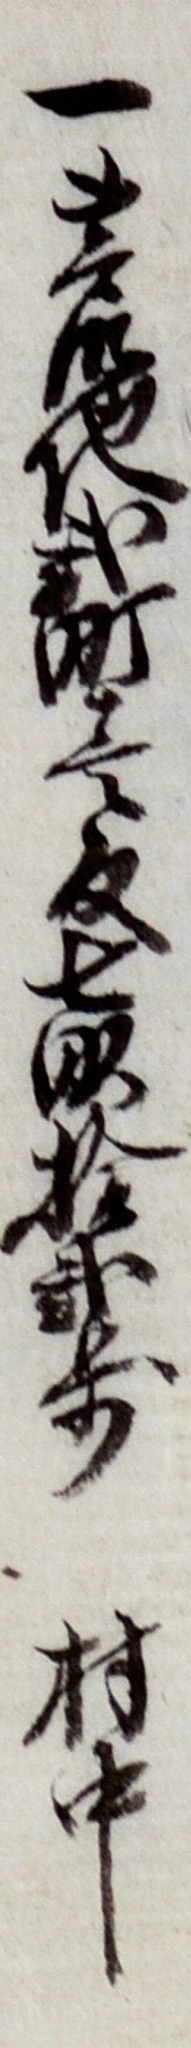一荒地弐町壱反七畝拾弐歩村中
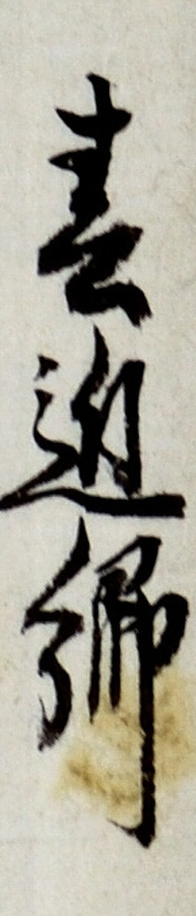春近郷
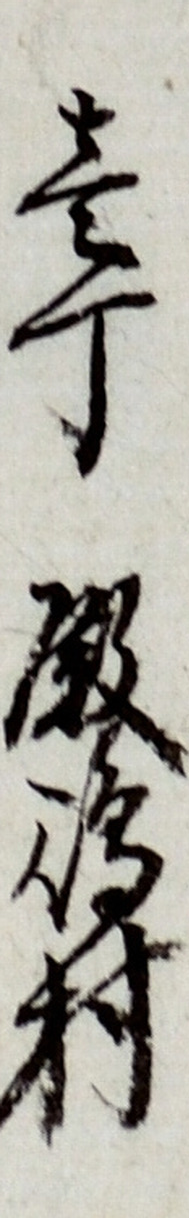壱丁殿島村
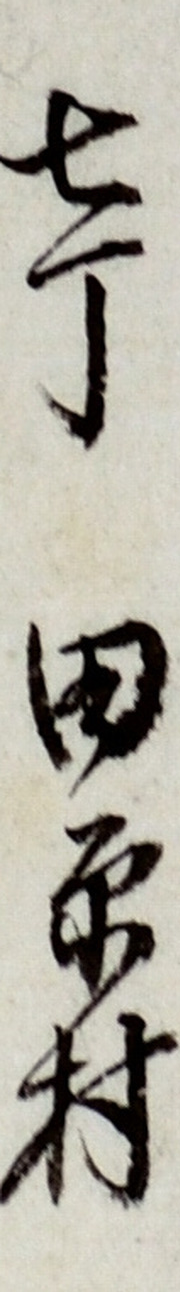七丁田原村
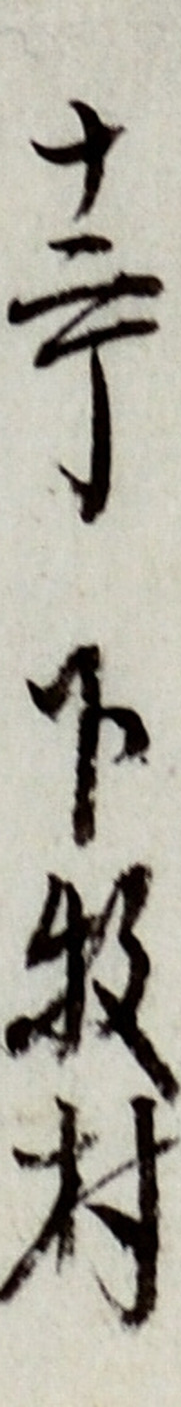十二丁下牧村
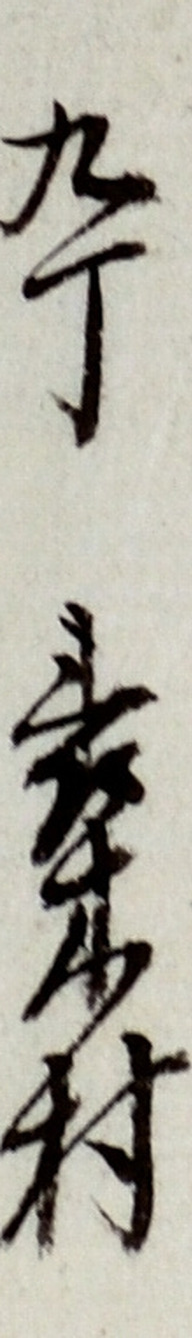九丁表木村
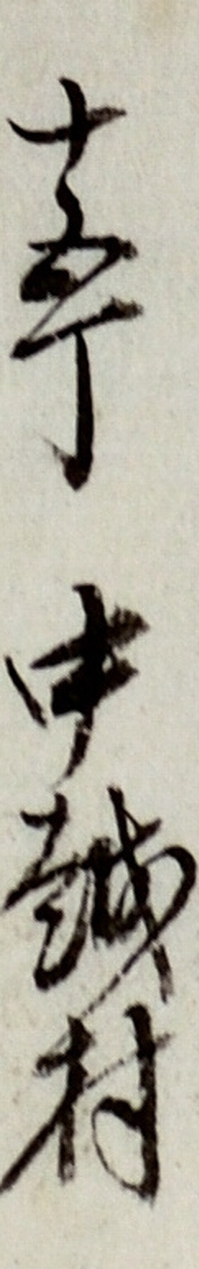十五丁中越村
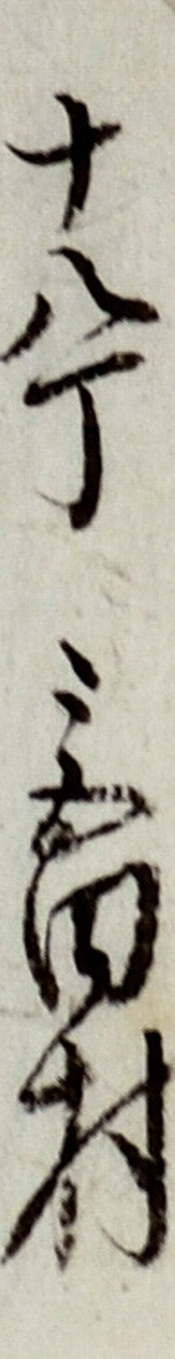十八丁宮田村
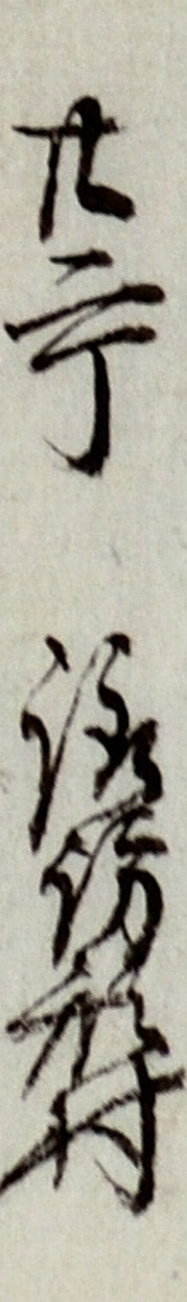廿二丁諏訪形村
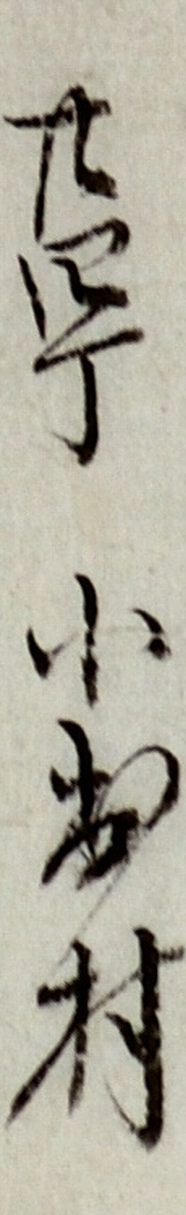廿四丁小出村

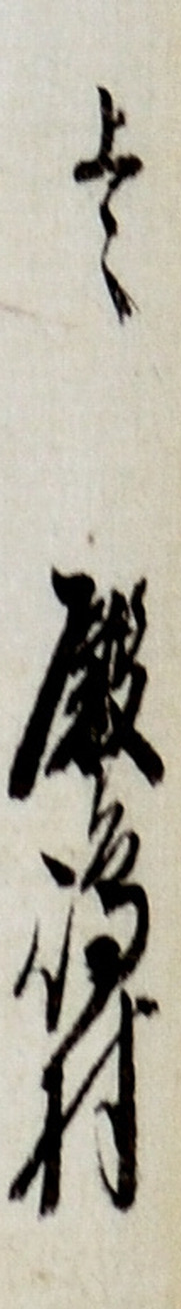上々殿島村
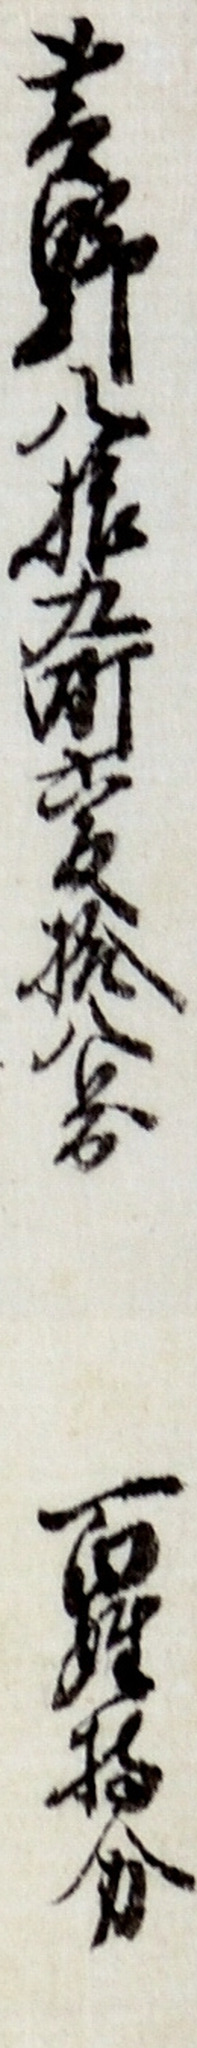一芝野八拾九町六反拾八歩百姓持分
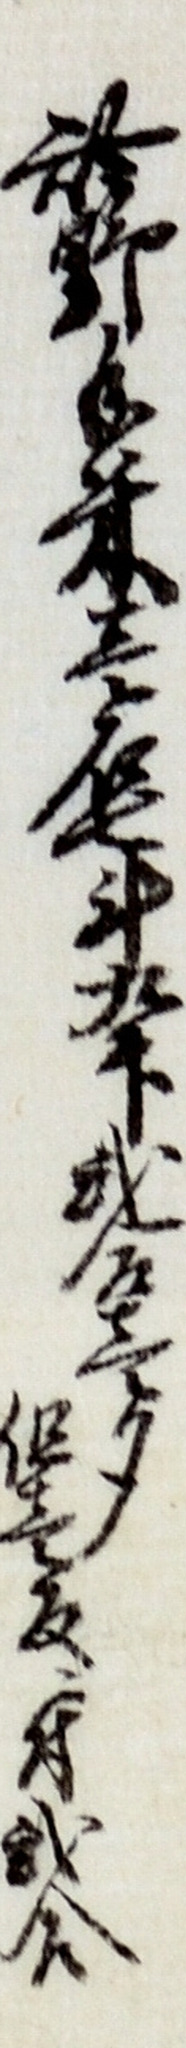此野手米壱石七斗九升弐合壱勺但壱反ニ付弐合

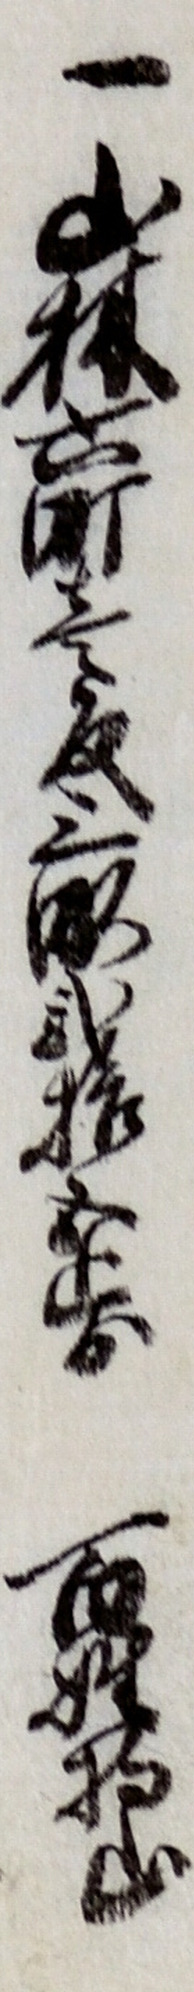一山林六町壱反三畝弐拾五歩百姓持山
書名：御領分中山林社地手控
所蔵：伊那市立高遠町図書館・合同会社AMANE
